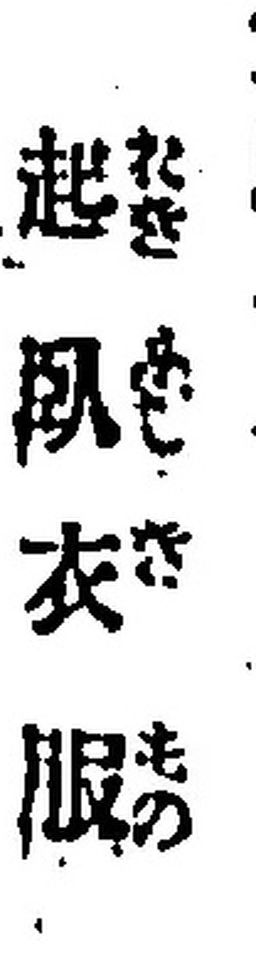起臥衣服
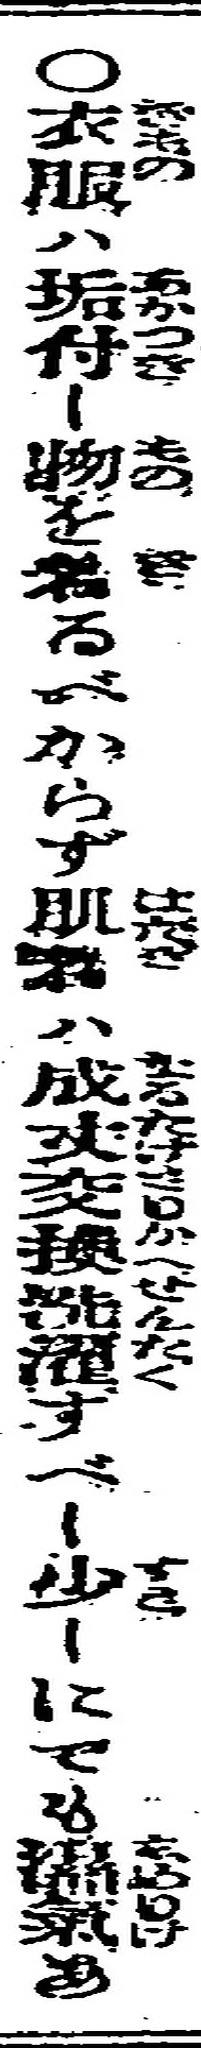〇衣服は垢付し物を着るべからず肌着は成丈変換洗濯すべし少しにでも濕氣あ
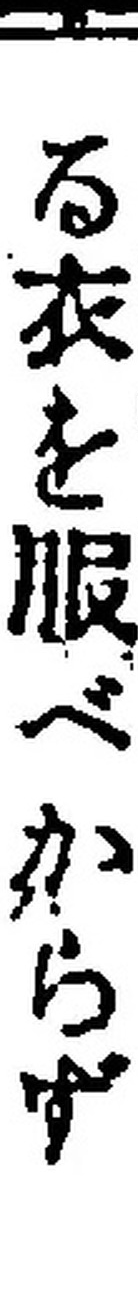る衣を服べからず
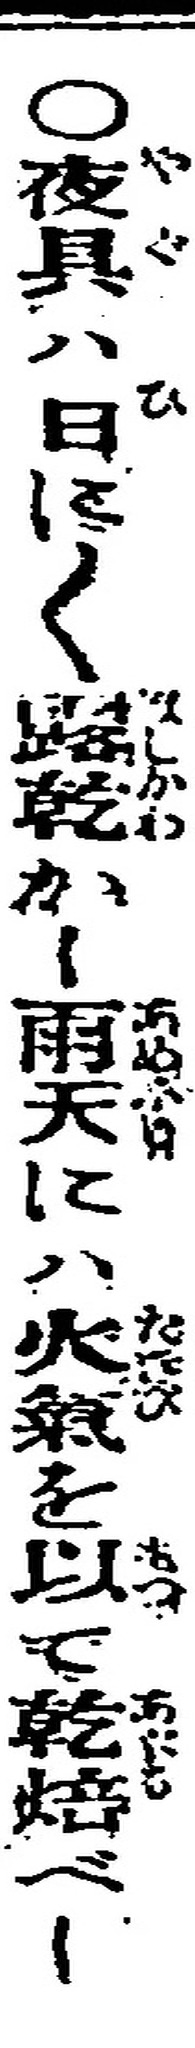〇夜具は日に〳〵露乾かし雨天には火氣を以て乾焙べし
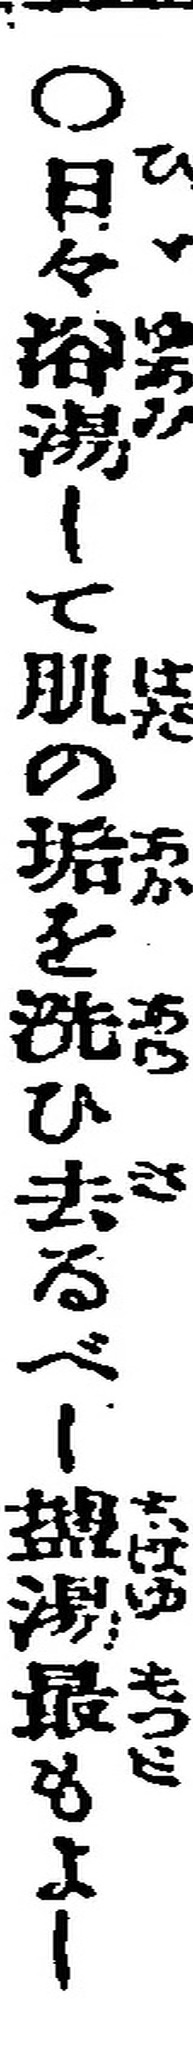〇日々浴湯して肌の垢を洗ひ去るべし䀋湯最もよし
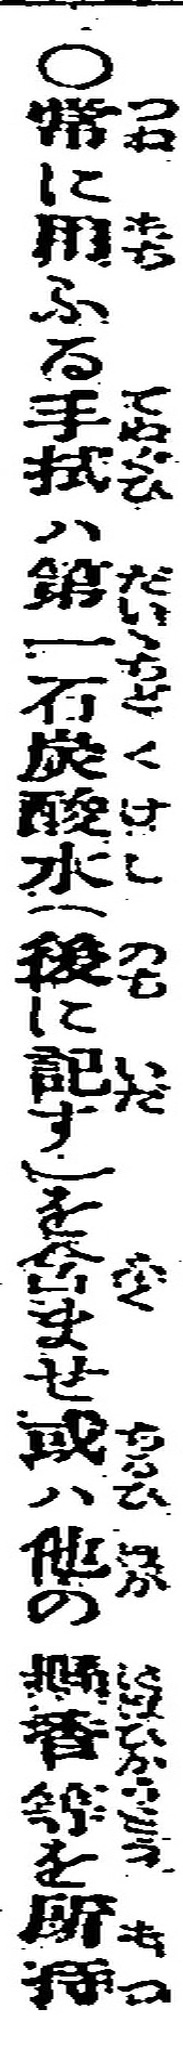〇常に用ふる手拭は第一石炭酸水[後に記す]を含ませ或は他の香等を所持
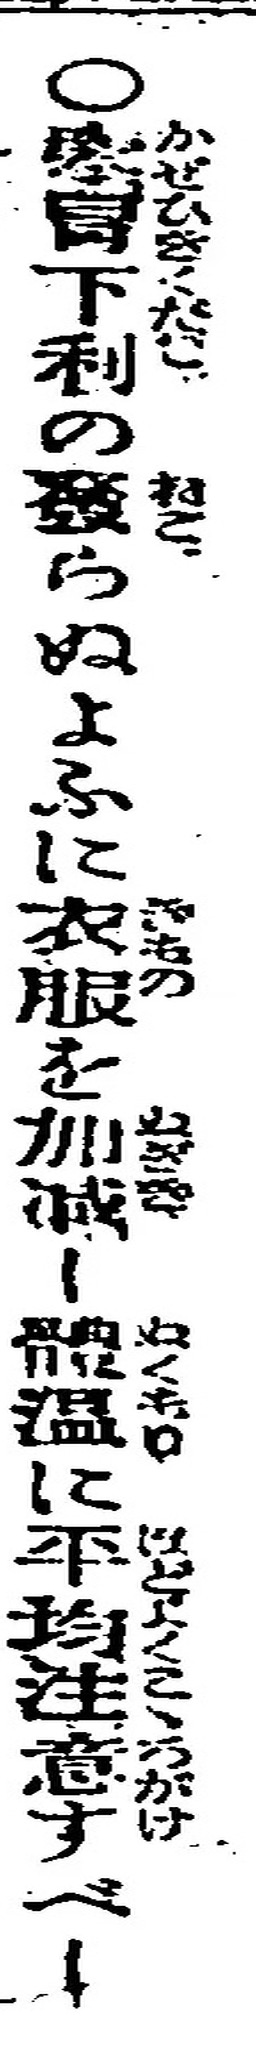〇感冒下利の發らぬよふに衣服を加減し體温に平均注意すべし
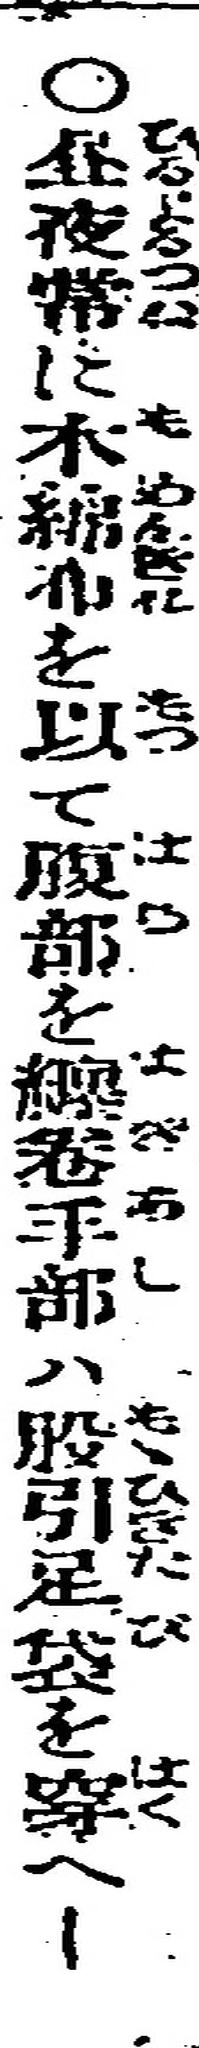〇昼夜常に木綿布を以て腹部を纏巻手部は股引足袋を穿へし
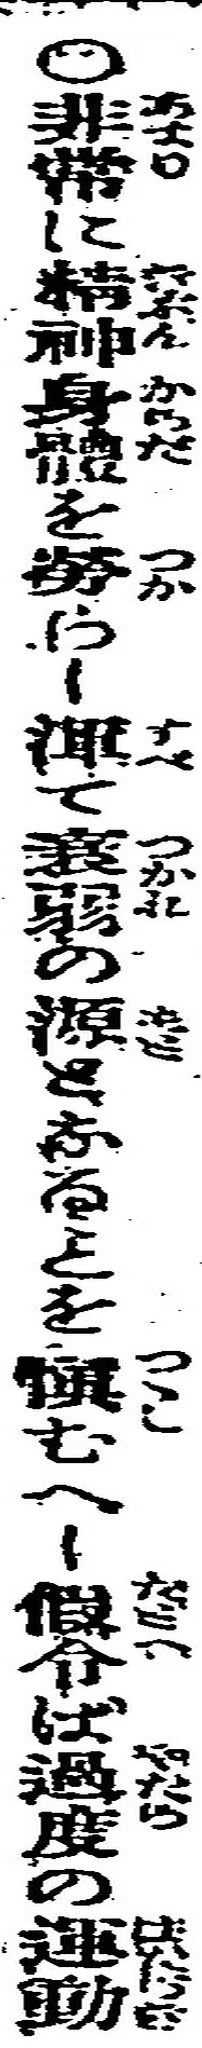〇非常に精神身體を労らし渾て衰弱の源となることを慎むへし假令ば過度の運動
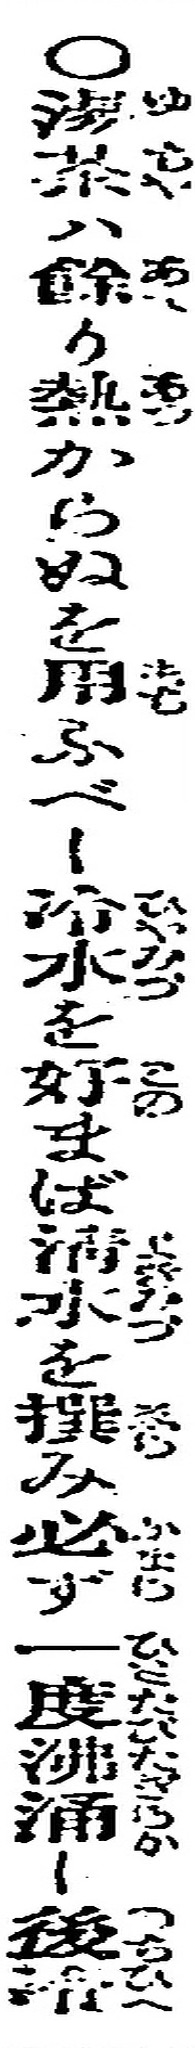〇湯茶は餘り熱からぬを用ふべし冷水を好まば清水を撰み必ず一度沸涌し後冷
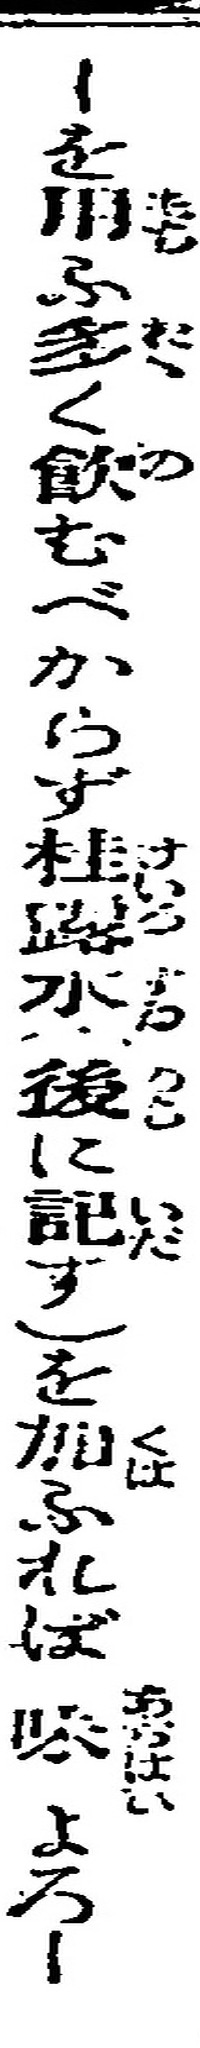しを用ふ多く飲むべからず桂露水[後に記す]を加ふれば味よろし
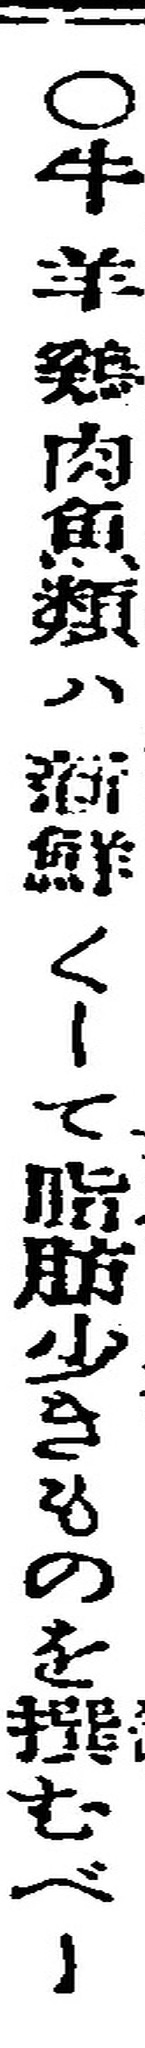〇牛羊鶏肉魚類は新鮮くして脂肪少きものを撰むべし
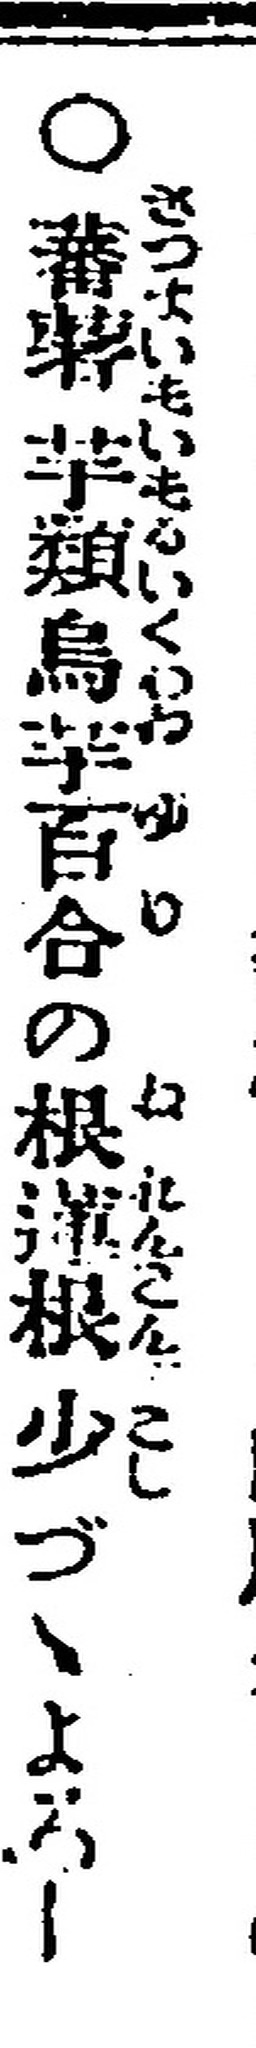〇蕃薯芋類烏芋百合の根蓮根少づゝよろし
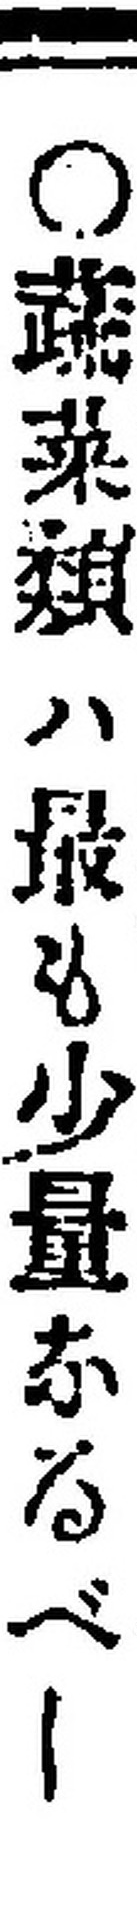〇蔬菜類は最も少量なるべし
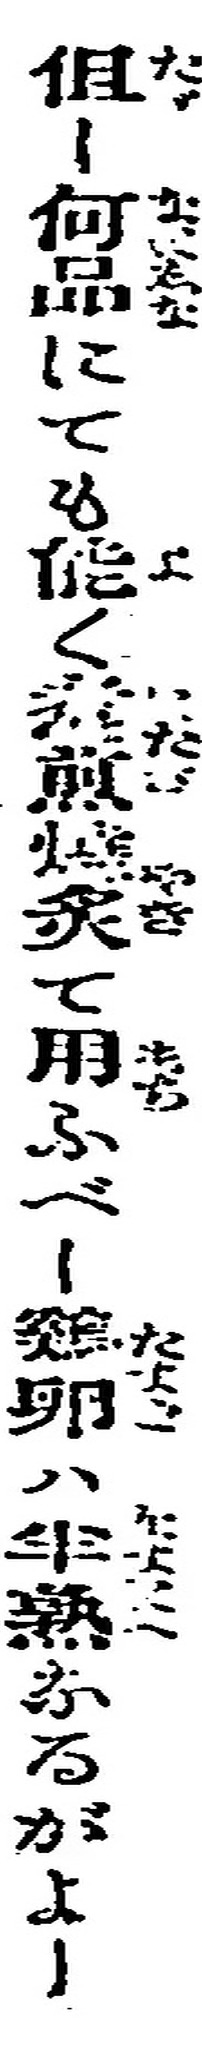但し何品にても能く煑煎焼炙て用ふべし鶏卵は半熟なるがよし
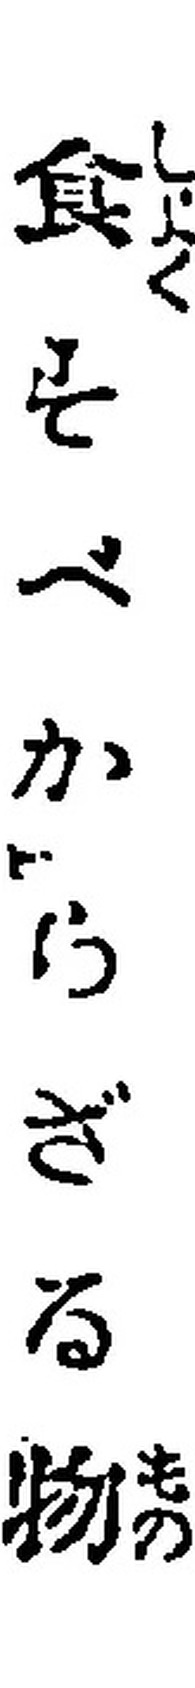食すべからざる物
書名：虎列剌病予防養生法訳解
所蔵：国立国会図書館 National Diet Library, JAPAN
